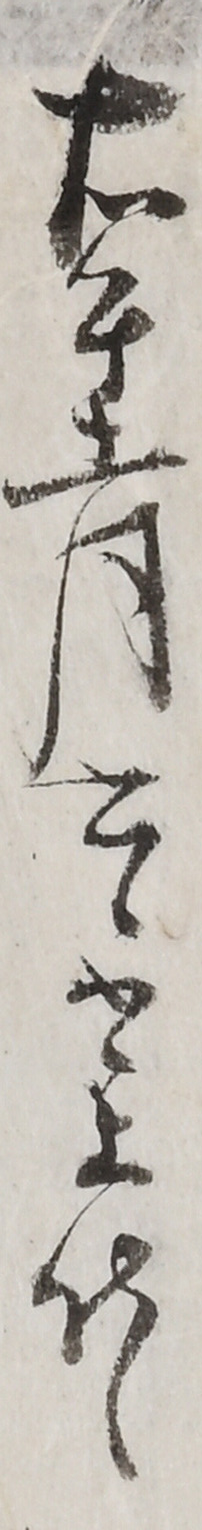右午十一月六日書上仕候
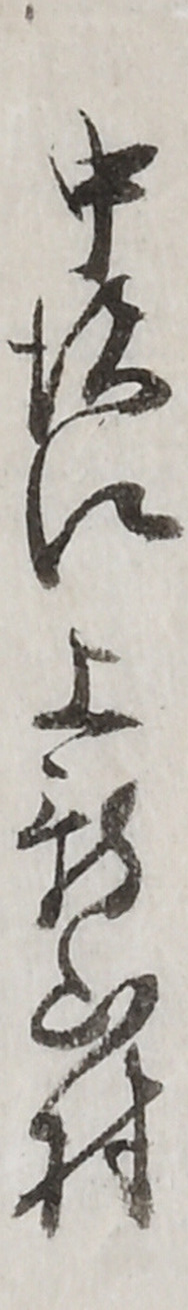中沢郷上新山村
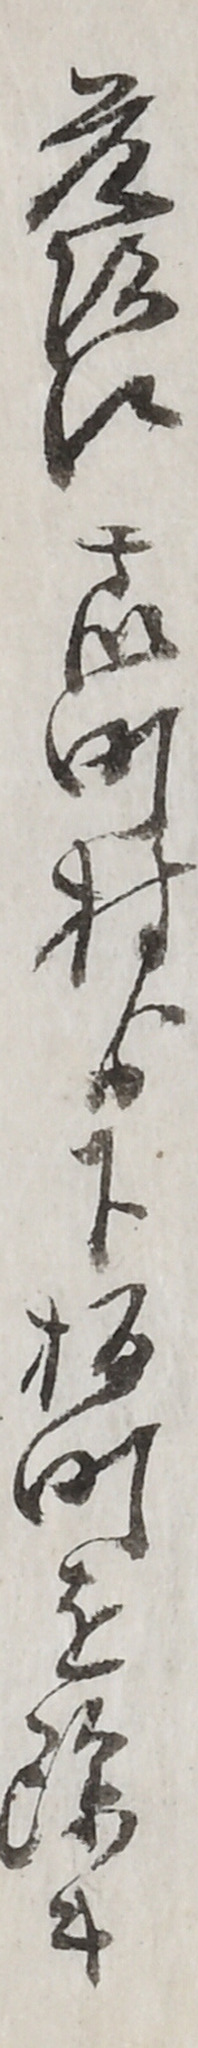藤沢郷荒町村より下板町を除キ
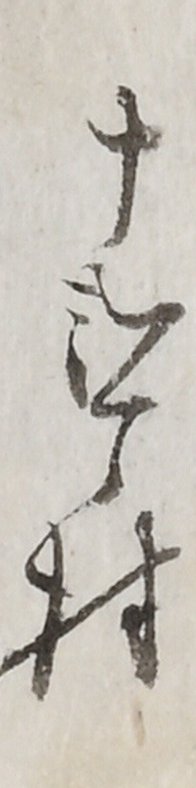十弐ヶ村
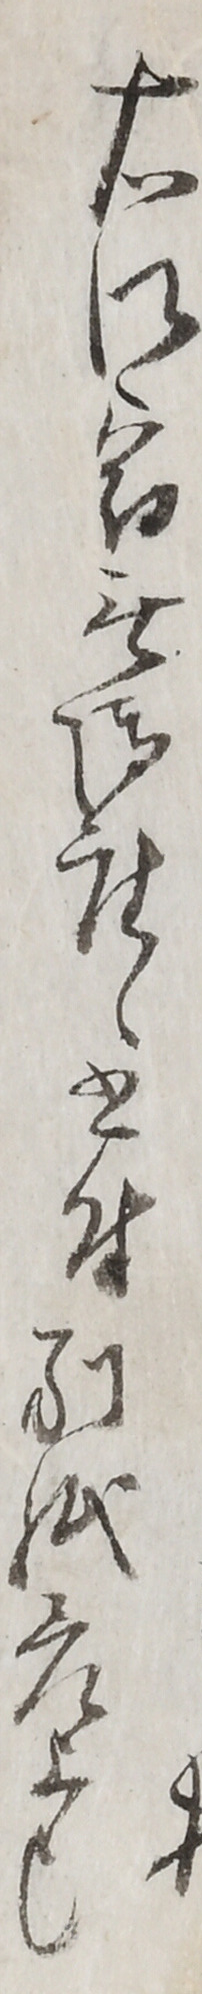右郷宿無御座候書付別紙差上申候

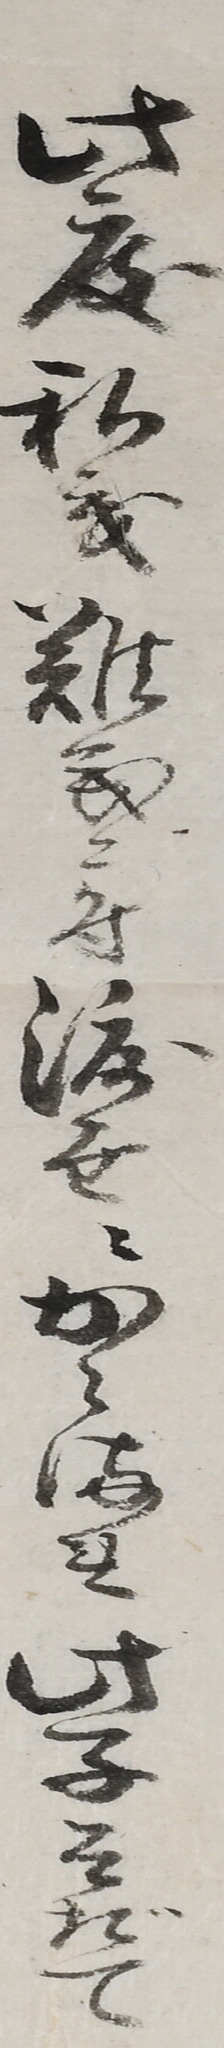一此度私義難義ニ付渡世ニからまれ此子そだて
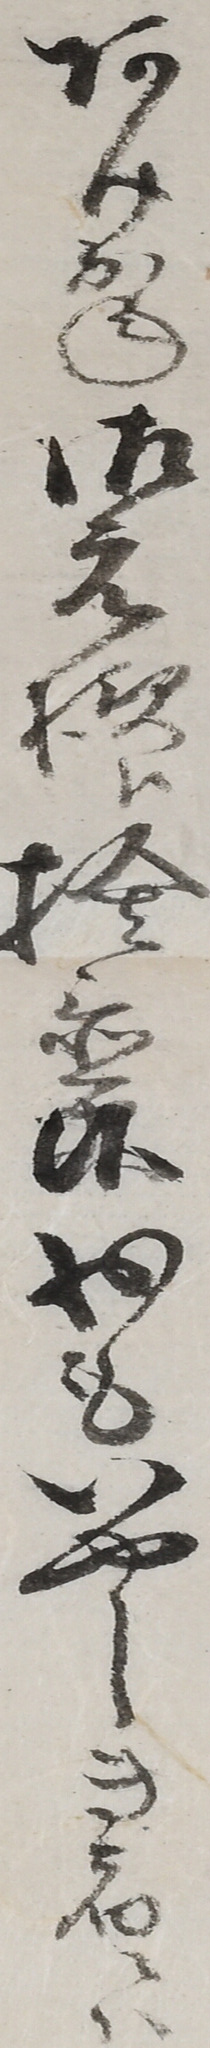あけかね御元様江捨置候少もいやしき者ニハ
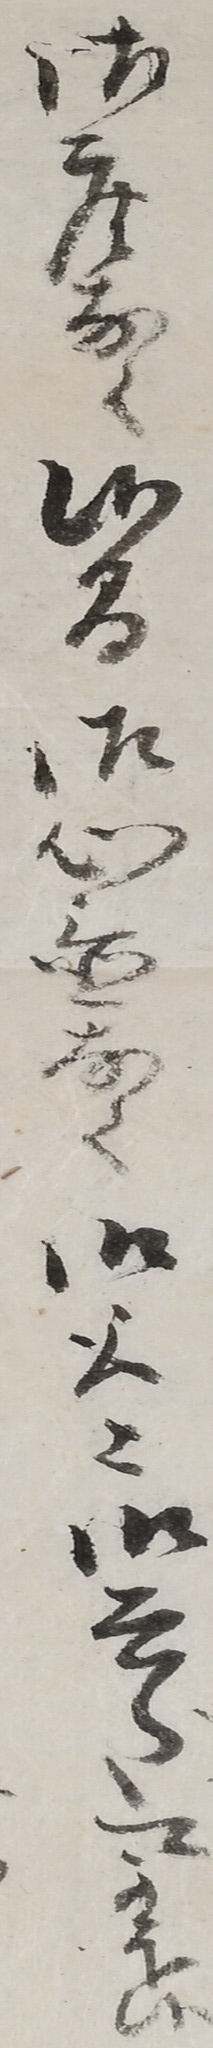御座なく候間御心置なく御取上御そだて可被下候
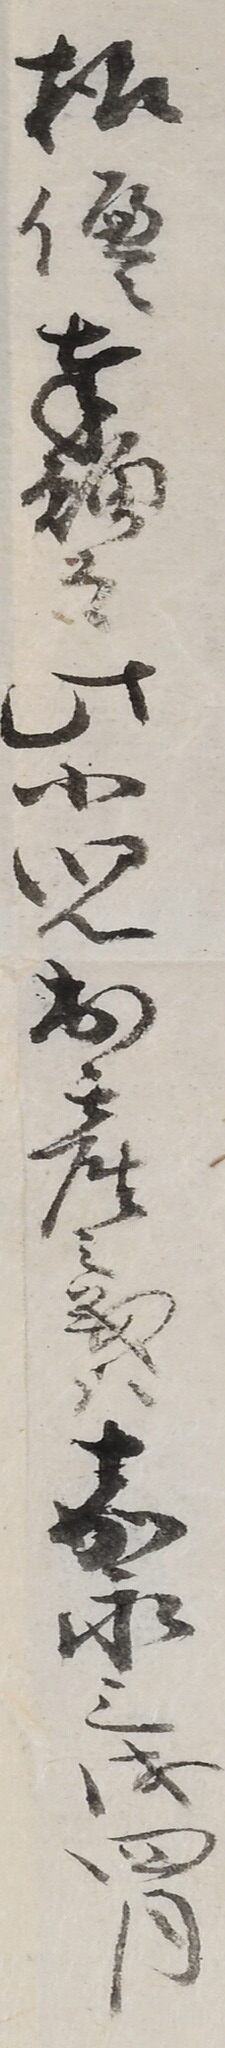様偏ニ奉願上候此小児出産之義ハ嘉永三戌四月
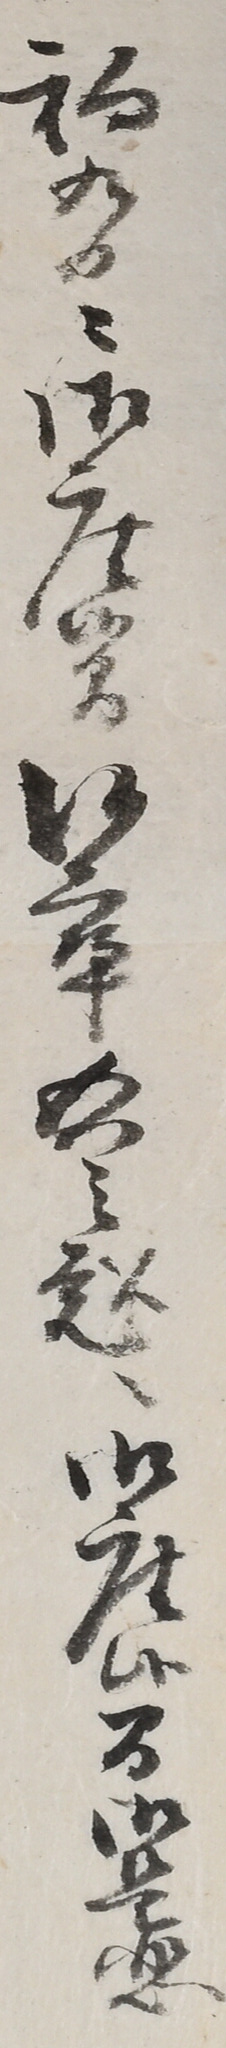初九日ニ御座候間何卒右之趣ニ御座候間御慈悲
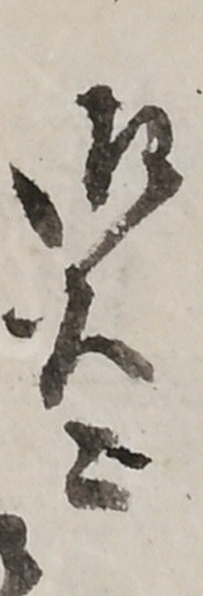御取上
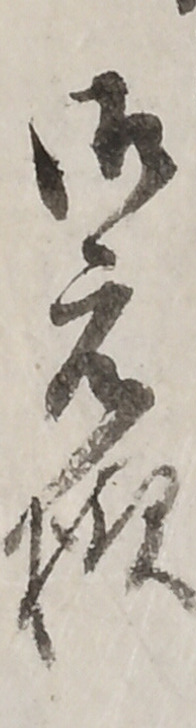御元様

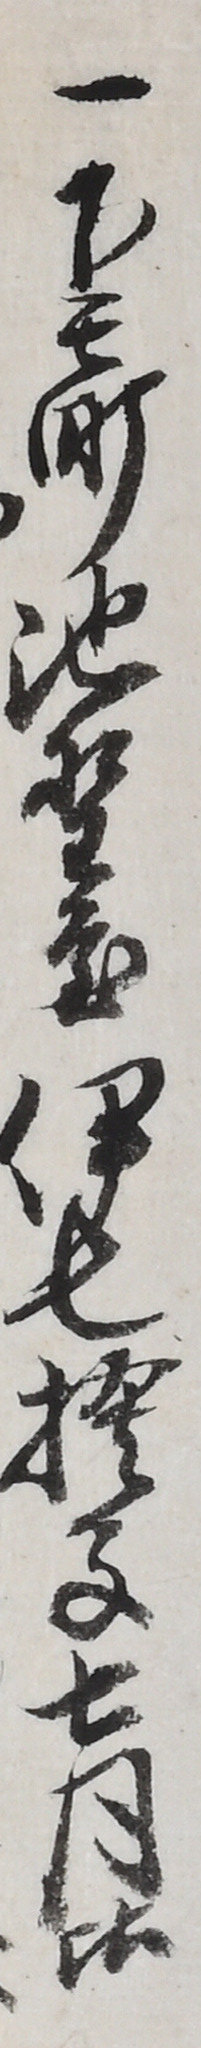一下モ町池野屋伊七捨子七月比
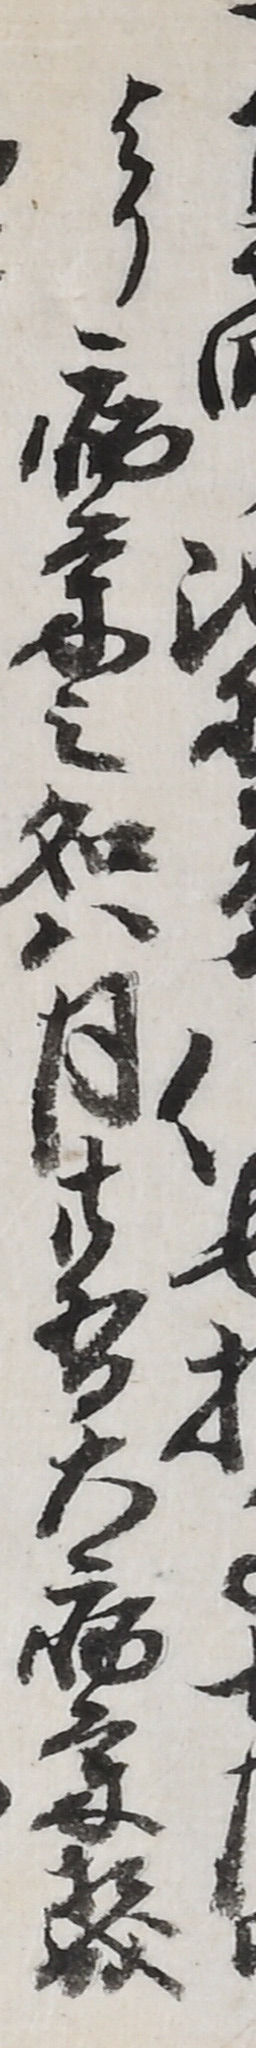より病気之処八月廿五日大病気相成
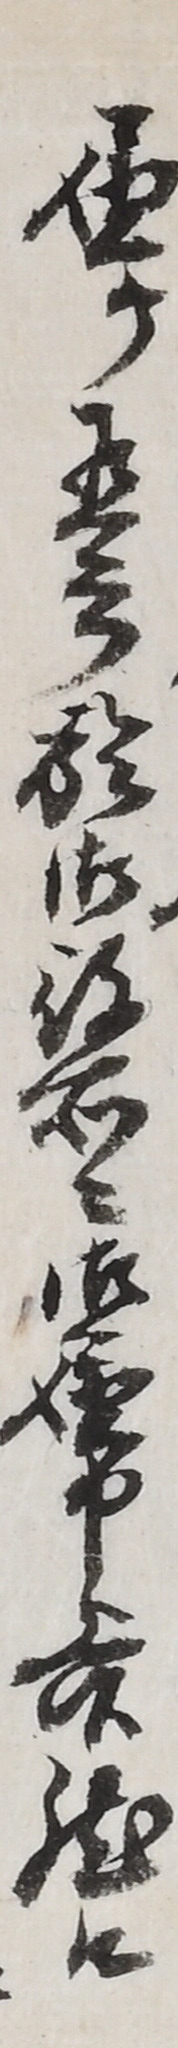届ヶ有之於御役所ニ御届申上候然ル
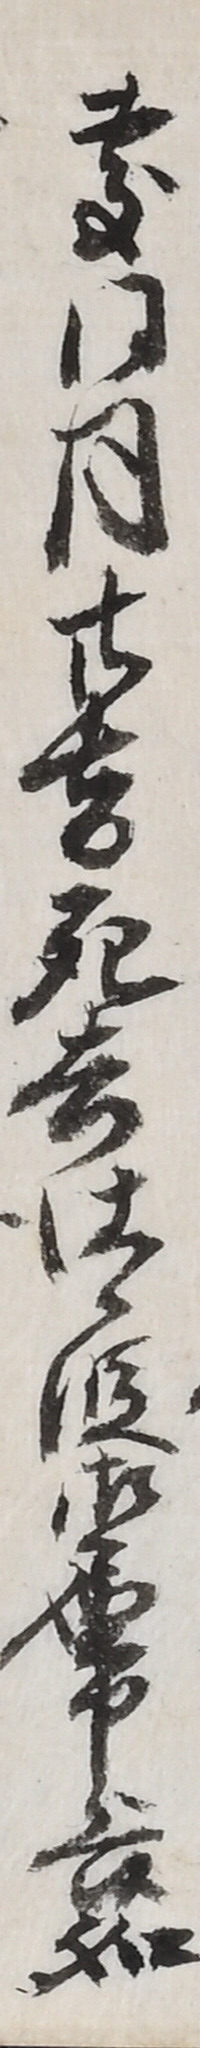処同月廿七日死去仕候段御届申上候処
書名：年内行事帳
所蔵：伊那市立高遠町図書館・合同会社AMANE
